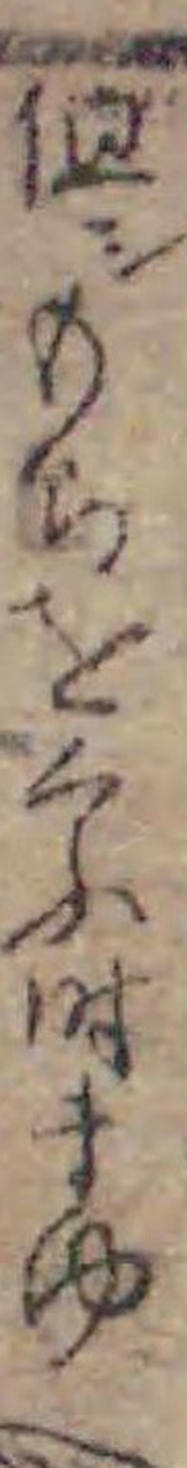但時まゆ
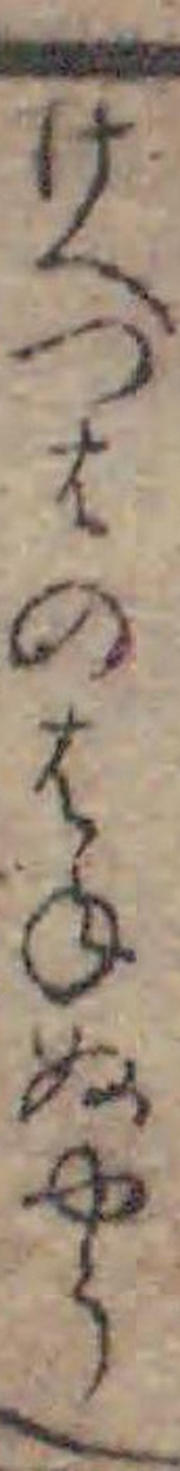けへつはのはねぬやう
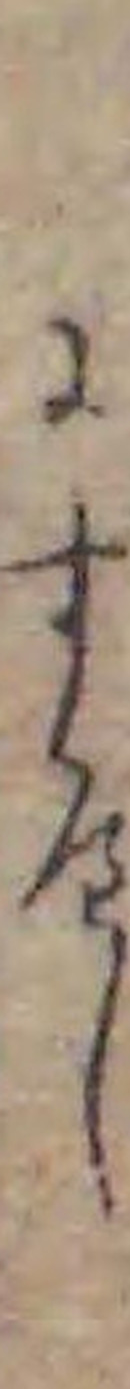にすべし

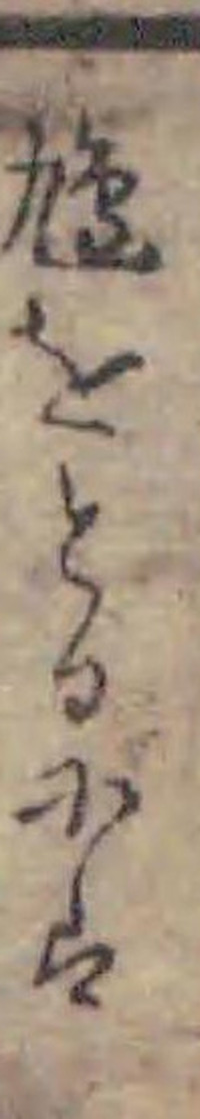鳩をとるには
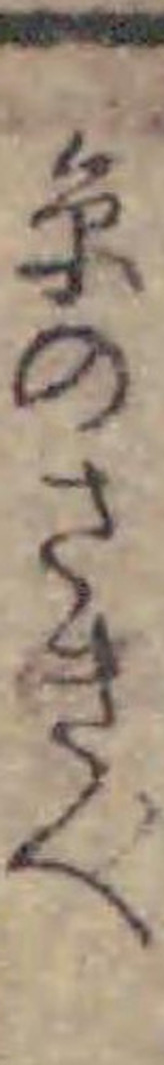糸のさきへ
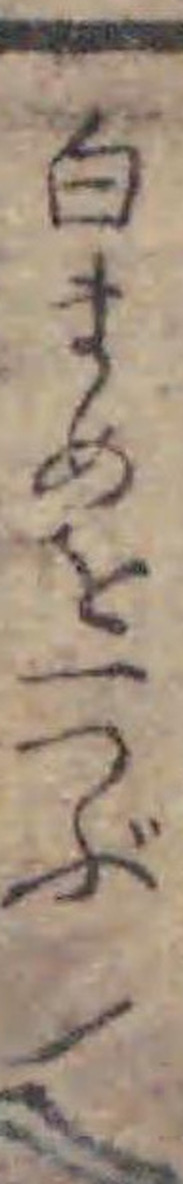白まめを一つぶ
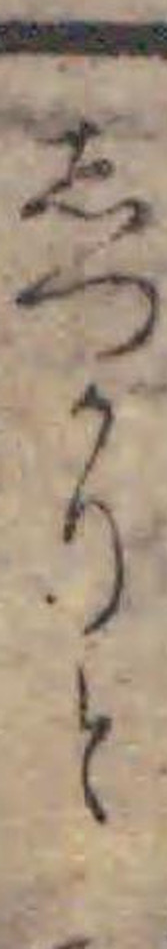しつかりと
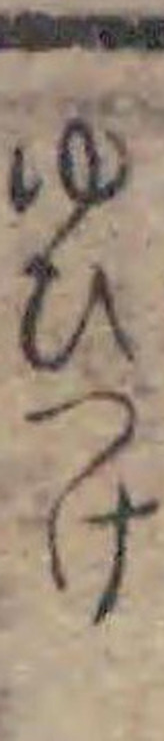ゆひつけ
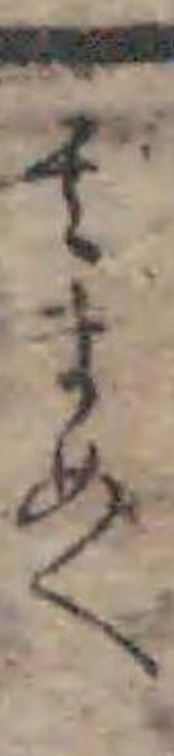其まめへ
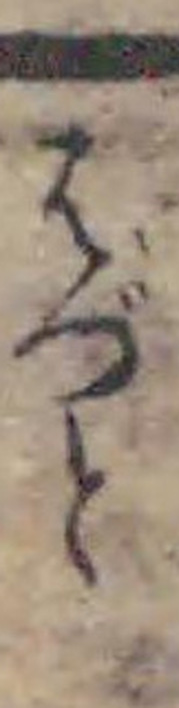はづと
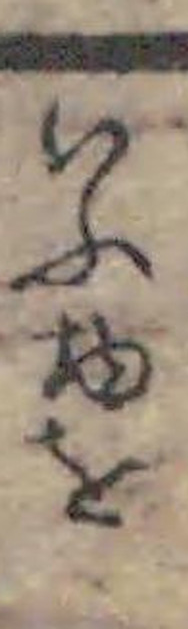いふ物を
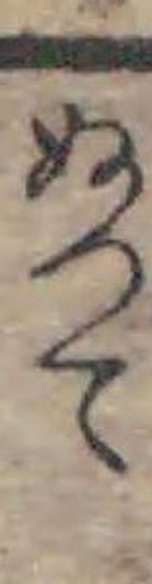ぬつて
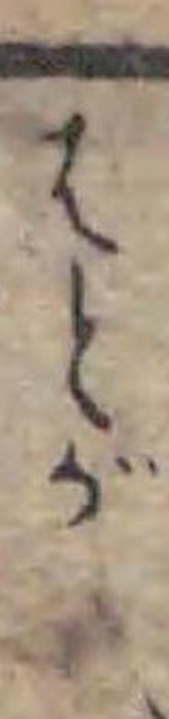はとが
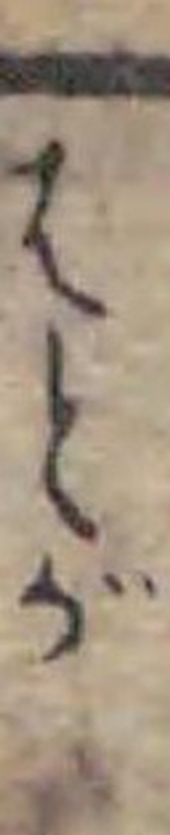はとが
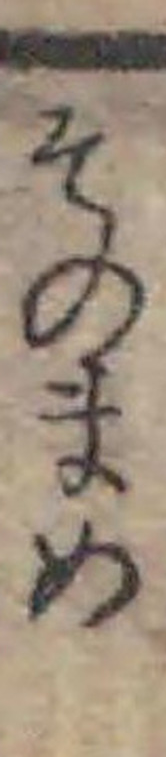そのまめ
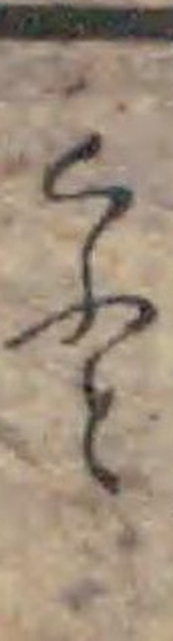くふと
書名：虚言八百万八伝 : 3巻
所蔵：国立国会図書館 National Diet Library, JAPAN
